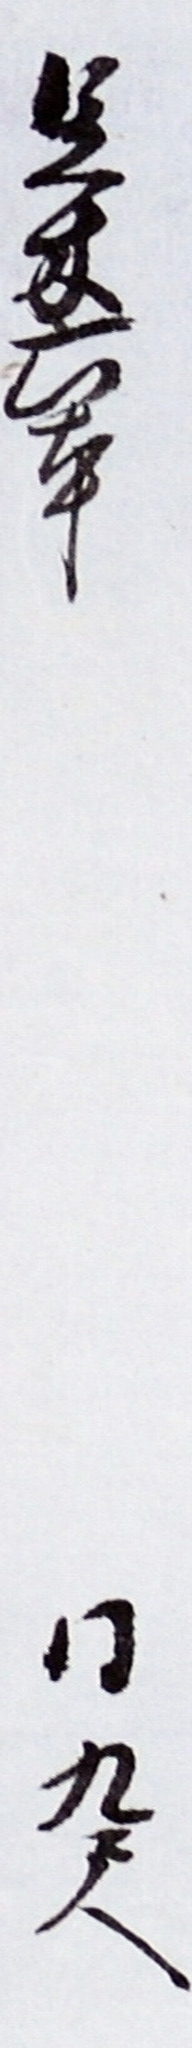足木六本同九尺
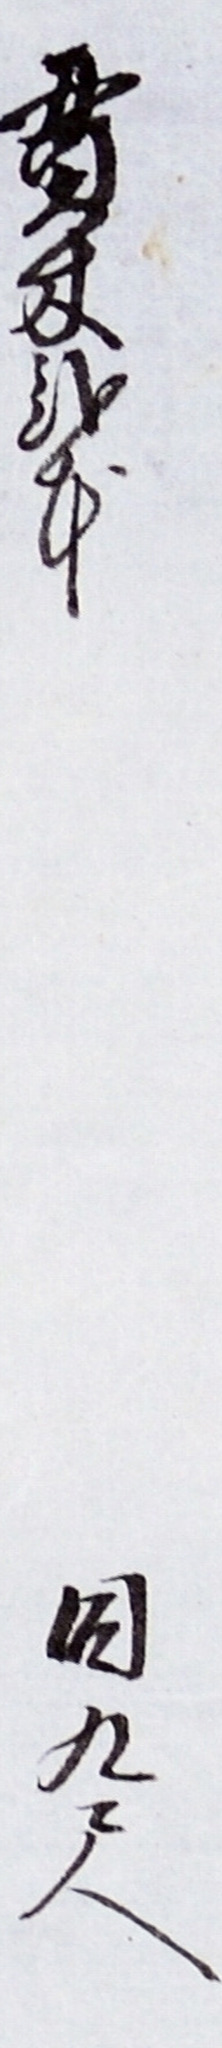貫木弐本同九尺
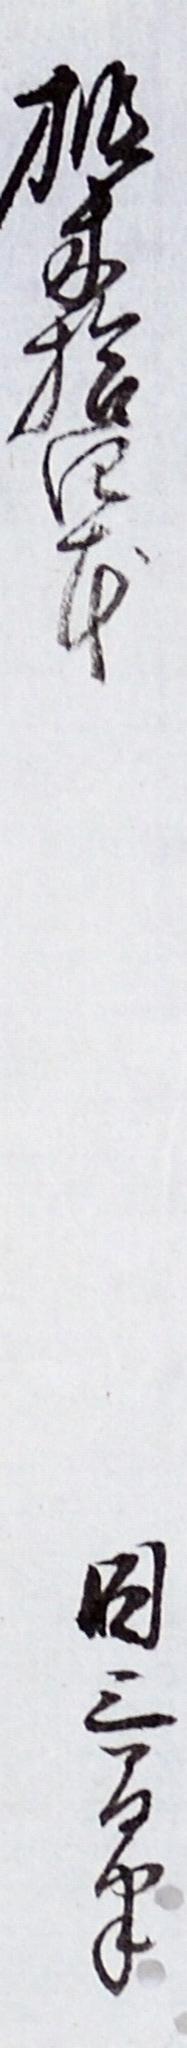樅木拾四本同三間半
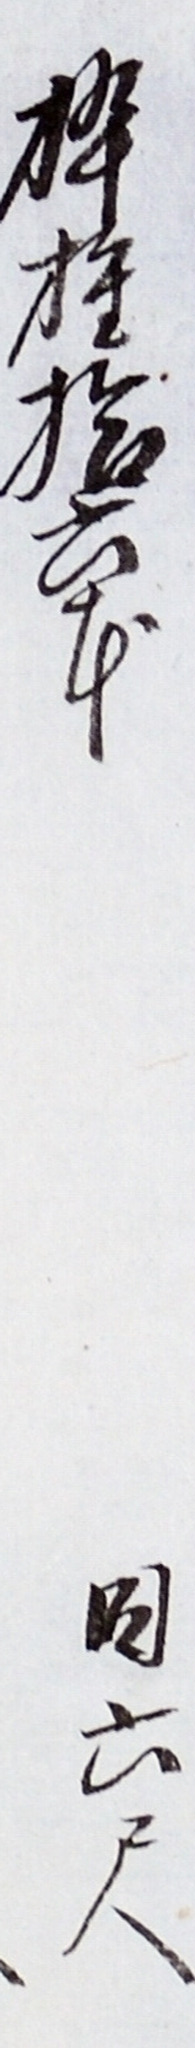砕拾六本同六尺
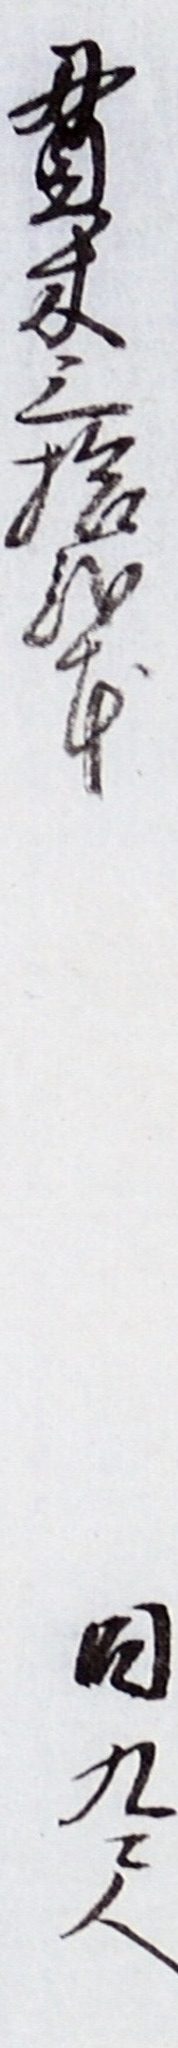貫木三拾弐本同九尺
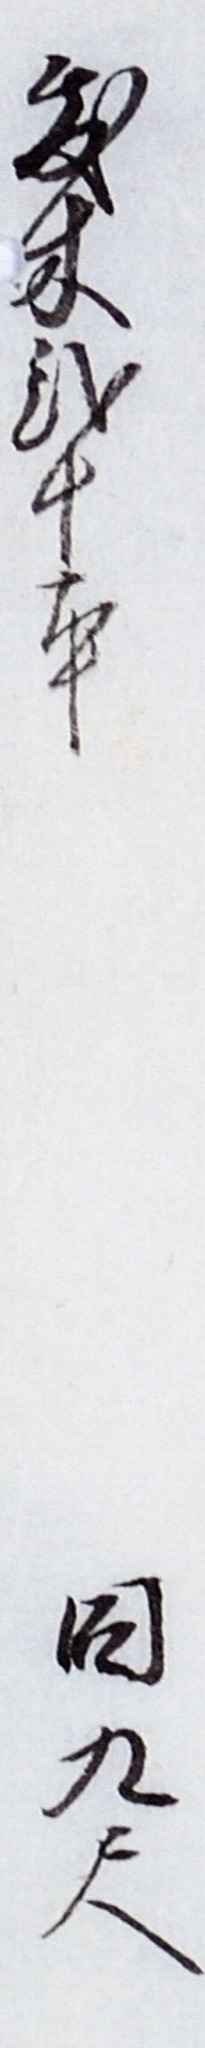敷米弐十本同九尺
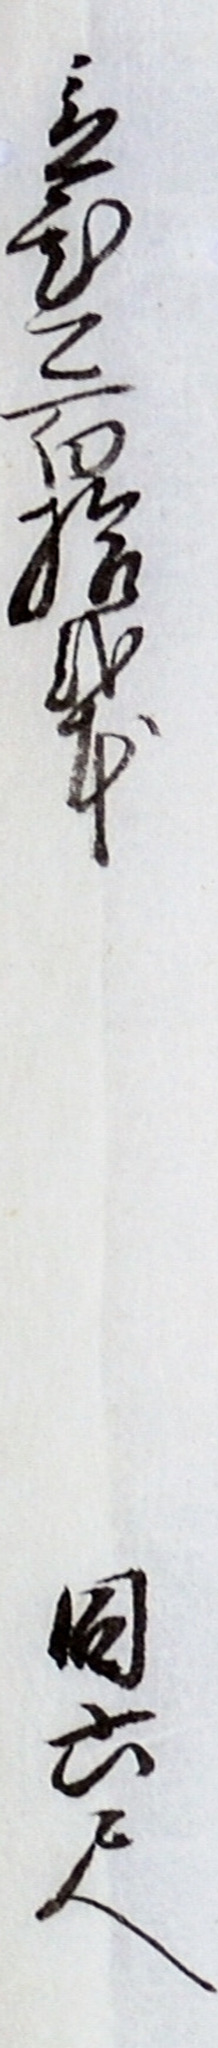立ひて百拾弐本同六尺
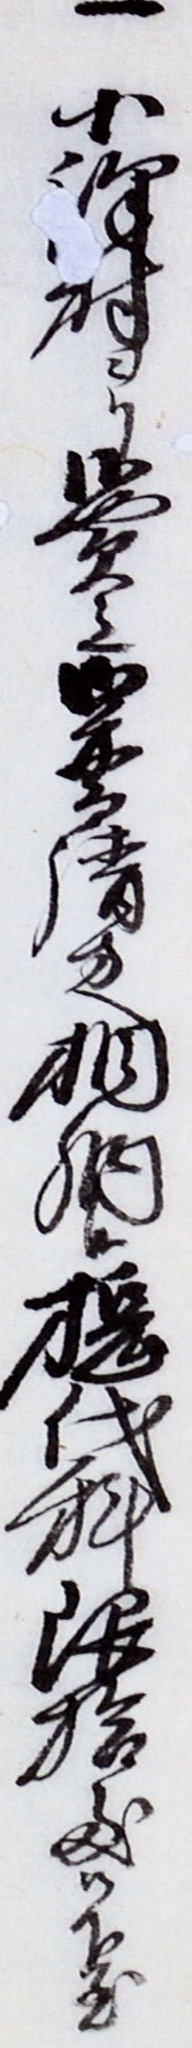一小澤村ヨリ御買上御普請方相納候橋代料銀拾匁被下置
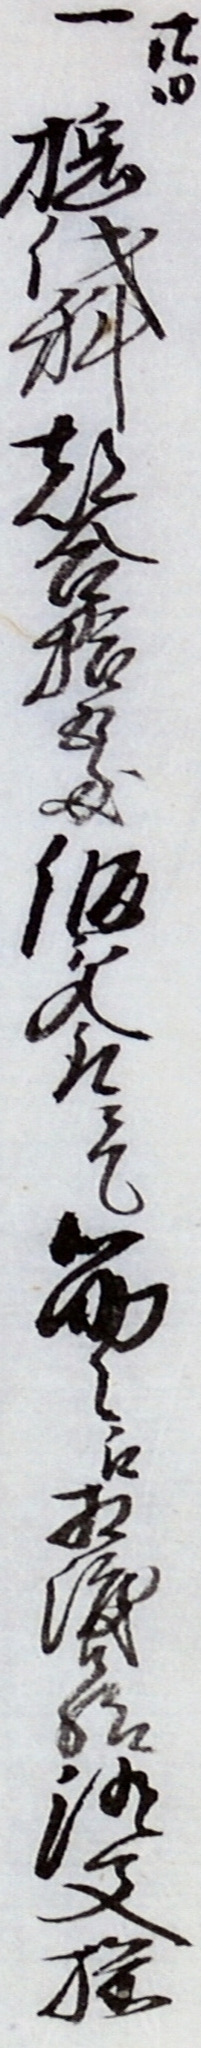一椹代科都合拾五匁仮受取ニて筋之被相渡候様証文
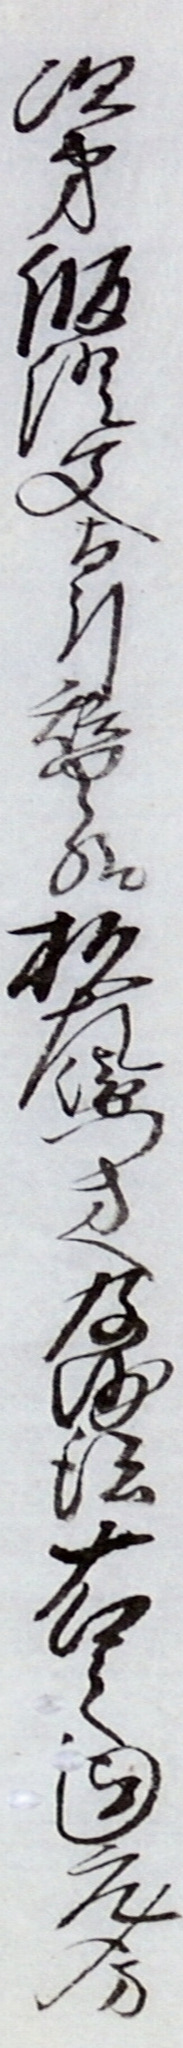次第仮證文と引替候様杉左衛門方へ及沙汰右之趣元〆方
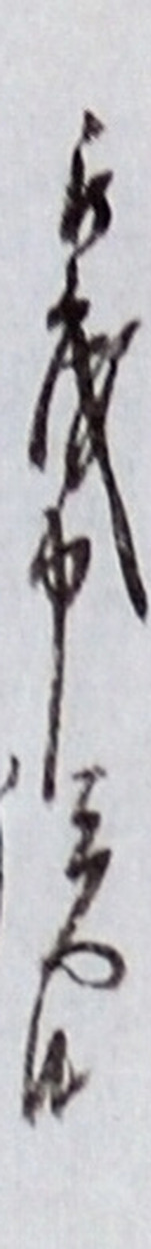被成申談候
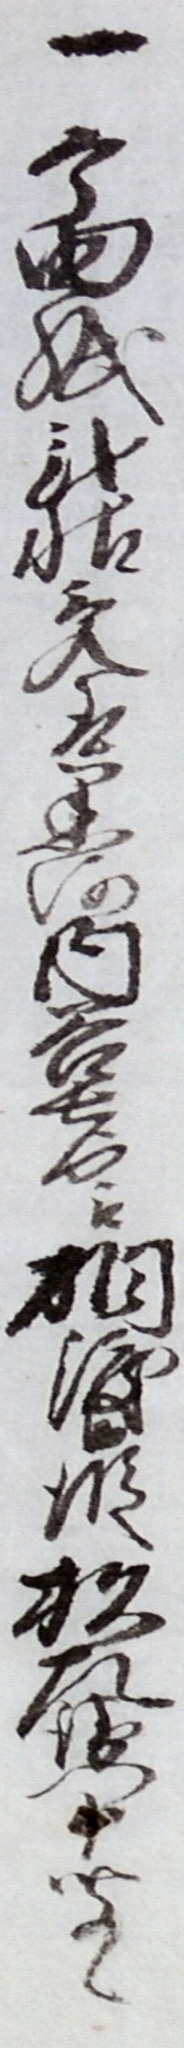一今田紙弐帖受取黒河内善右衛門被相渡候段杉左衛門申聞候
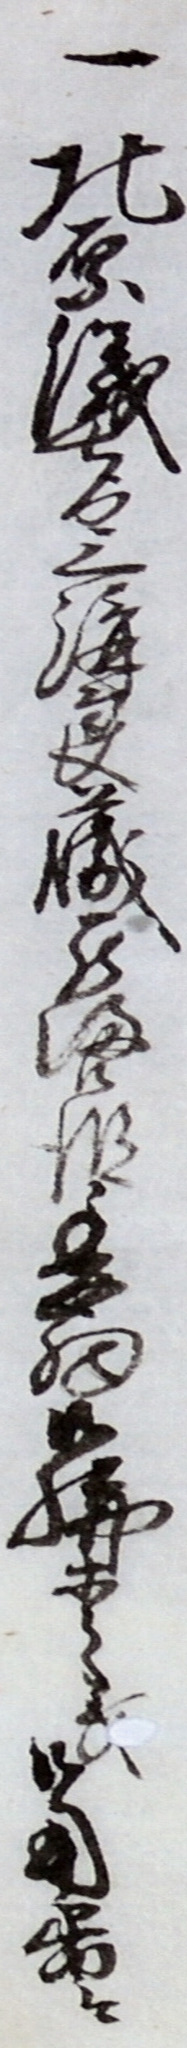一北原儀右衛門三溝良蔵罷帰候段委細御払等之義御用番江
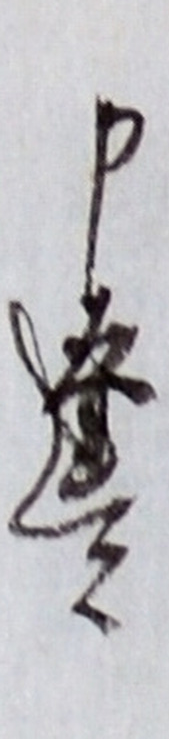申達候
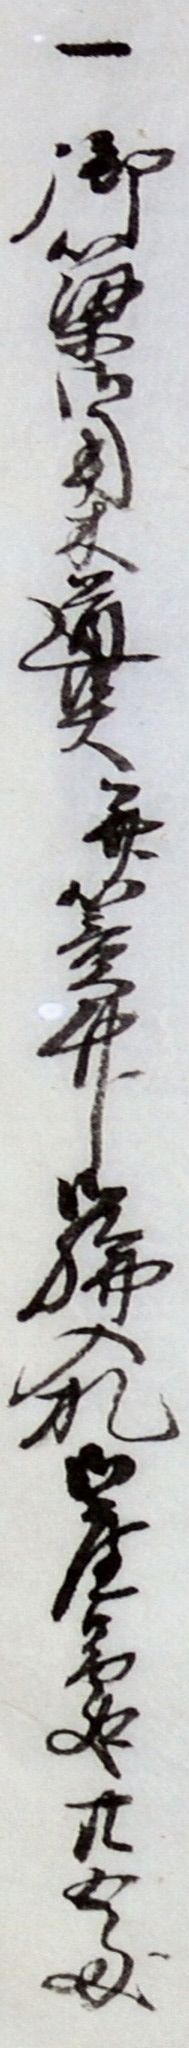一御簗御用木道具并箒竹御払入札御座候処廿五匁

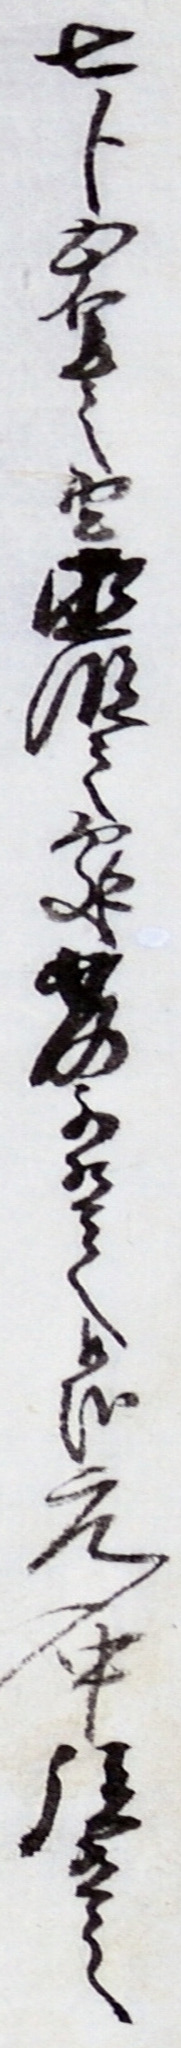七分五厘之由直段之処可有之候哉元〆中請有之
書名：御山奉行御用控
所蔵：伊那市立高遠町図書館・合同会社AMANE
